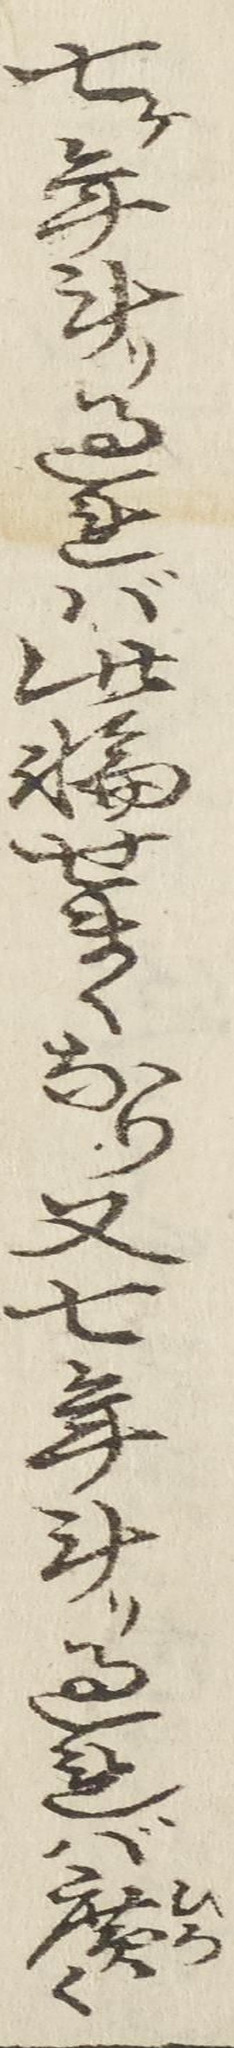七ケ年計り過れば此輪せまくなり又七ケ年計り過れば広く
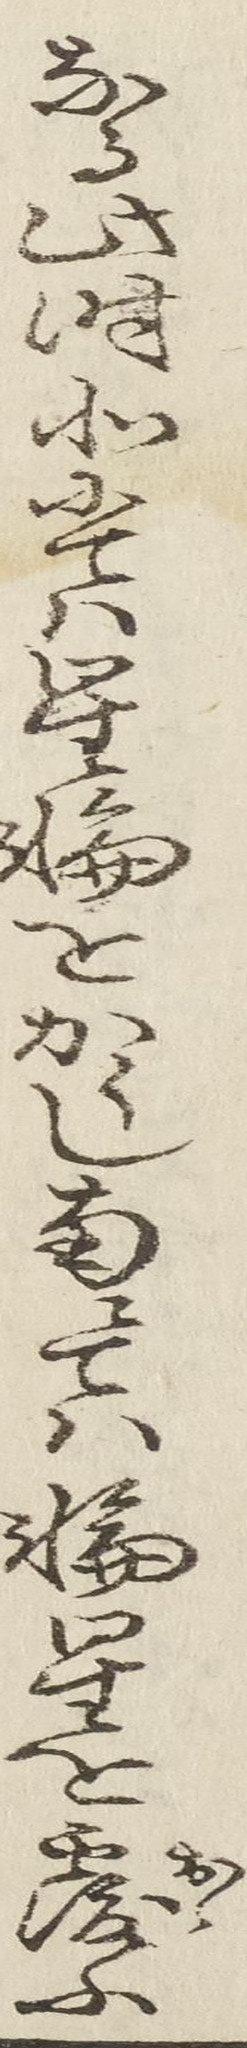なる此時北にては星輪をかくし南ニては輪星を覆ふ
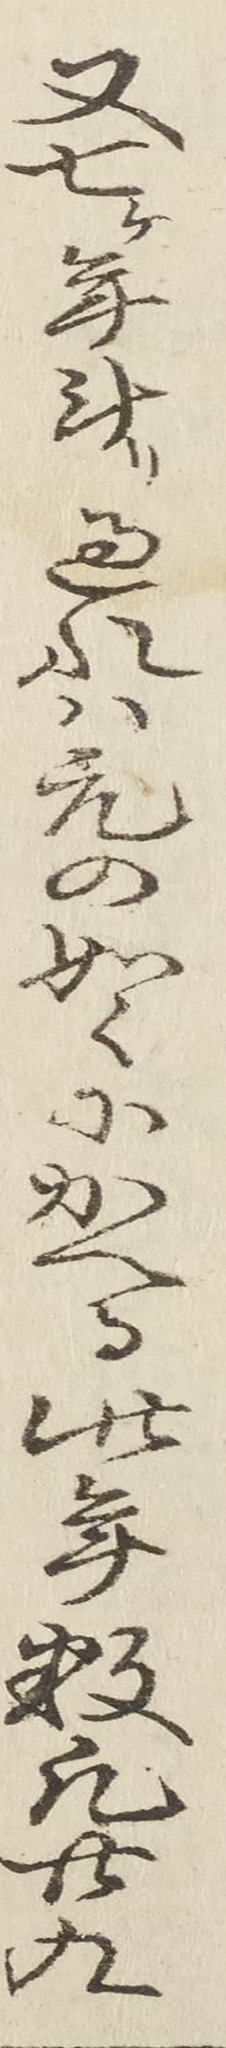又七ケ年計り過れば元の如くにかへる此年数凡廿九
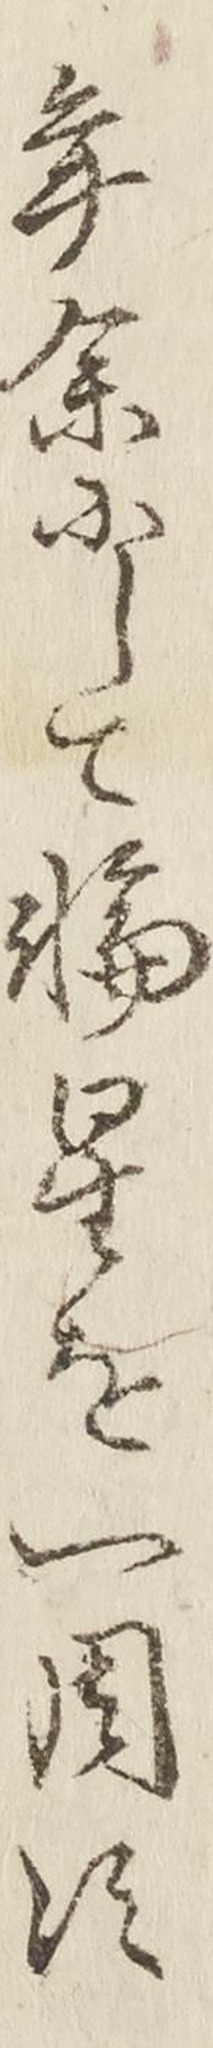年余にして輪星を一周す
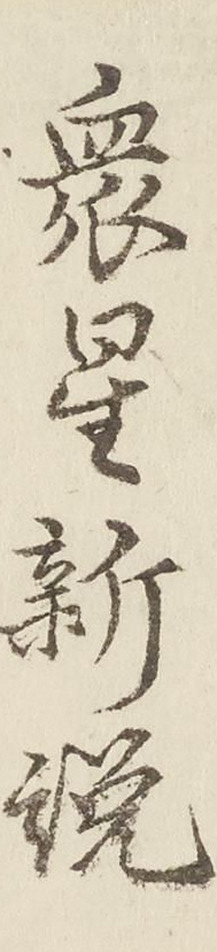衆星新説
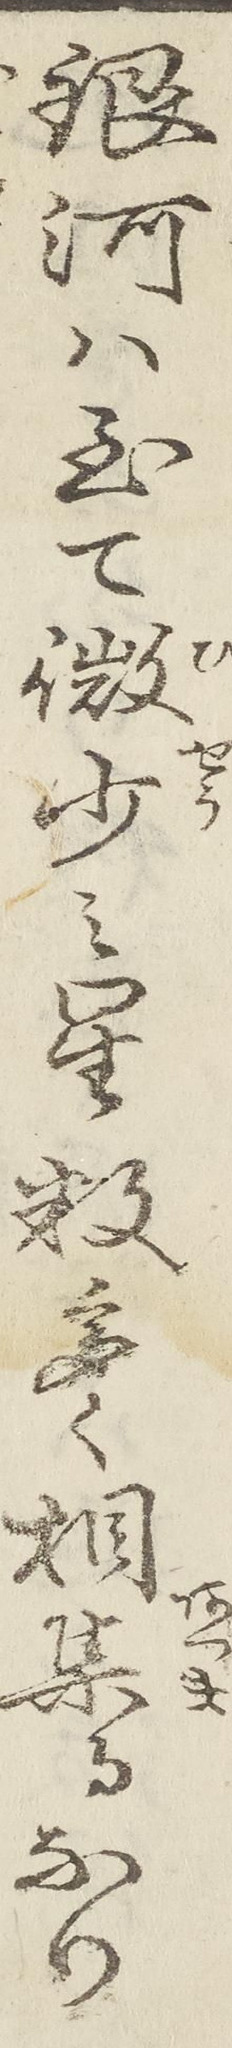銀河は至て微少之星数多く相集るなり
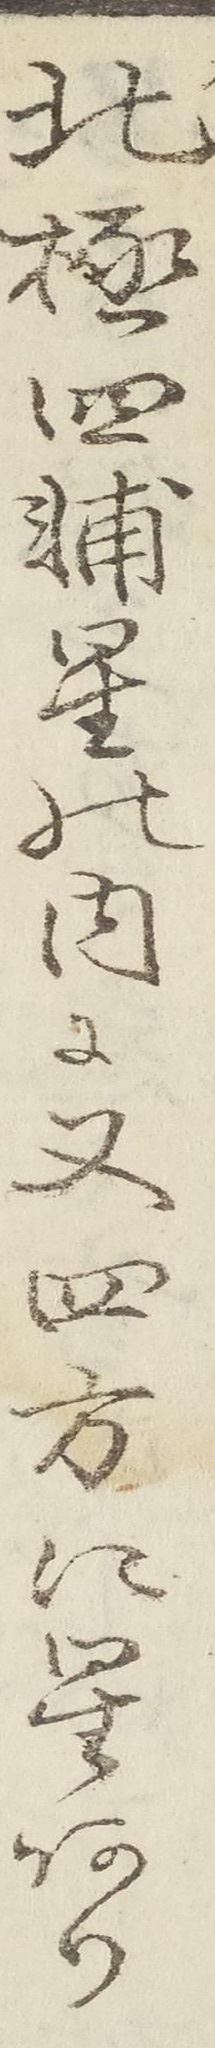北極四輔星の内に又四方に星あり
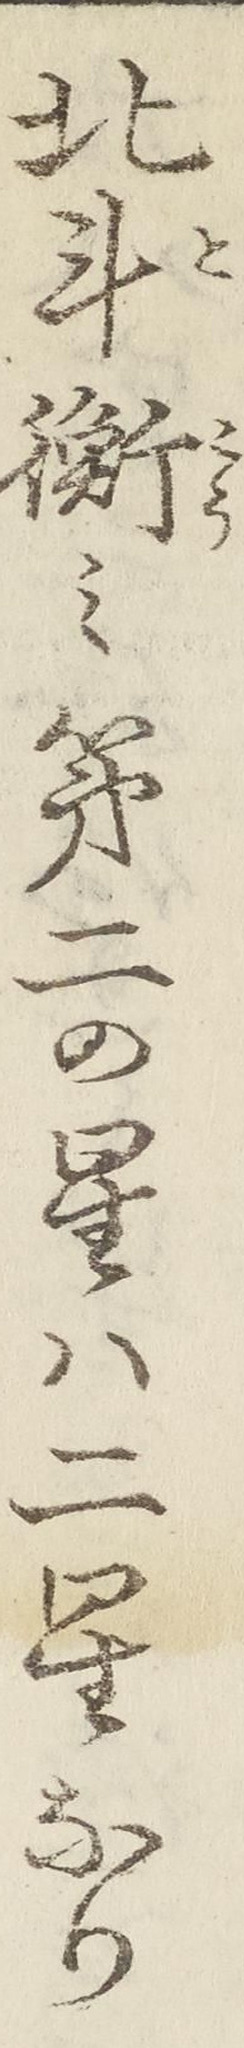北斗衡之第二の星は二星なり
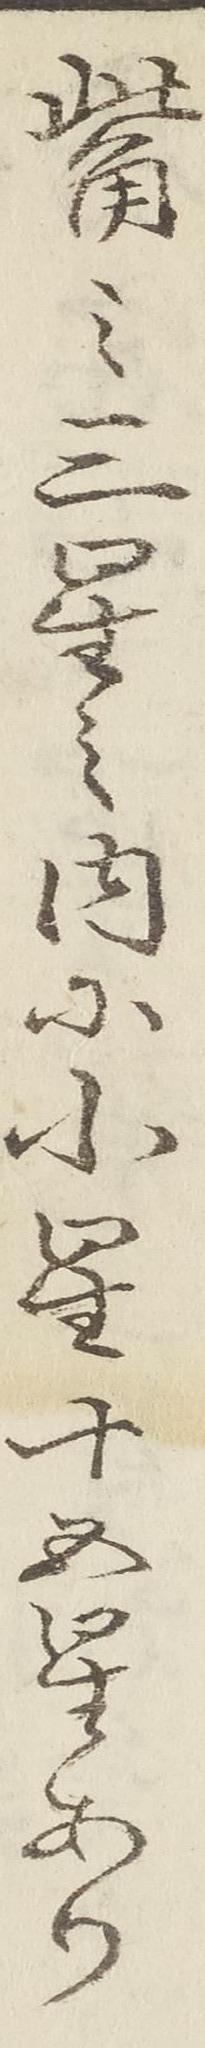觜之三星之内に小星十五星あり
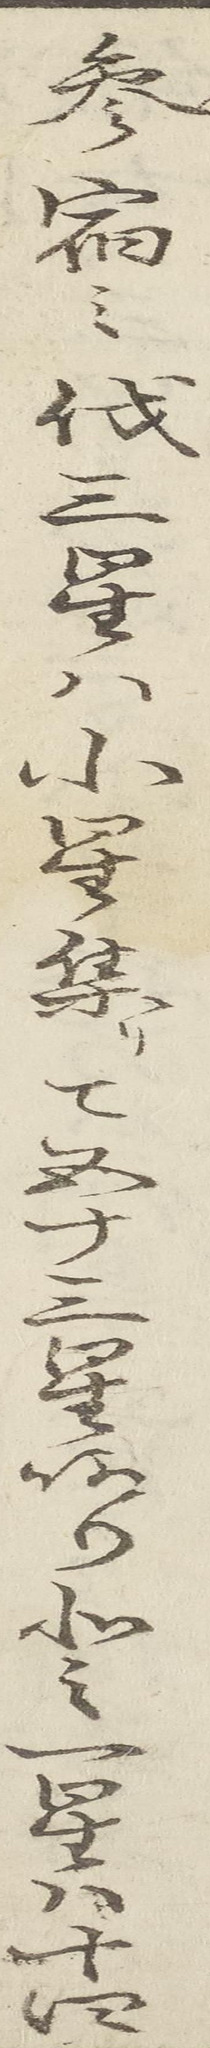参宿の伐三星は小星集りて五十三星あり北之一星は十四
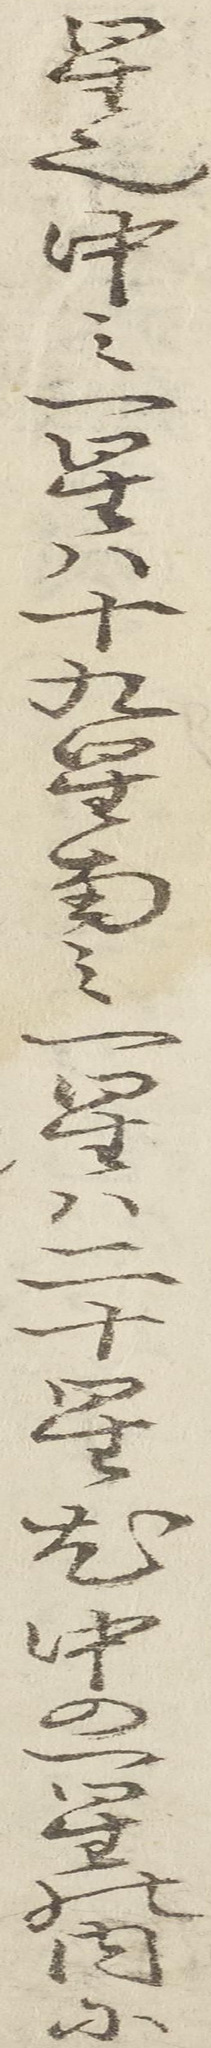星也中之一星は十九星南之一星は二十星尤中の一星の内に
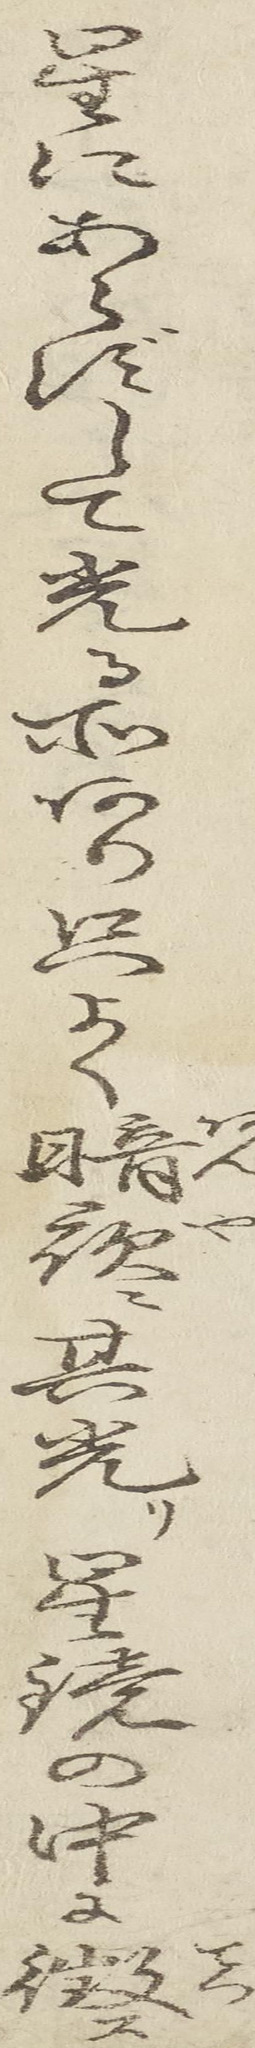星にあらずして光る所あり只よく暗夜ニ其光り星鏡の中に微ス
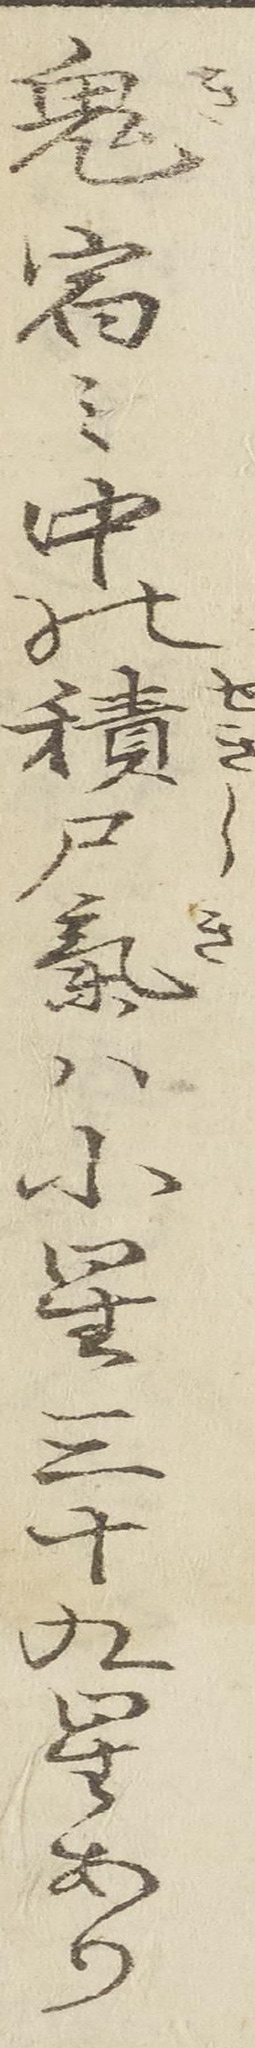鬼宿之中の積尸気は小星三十九星あり

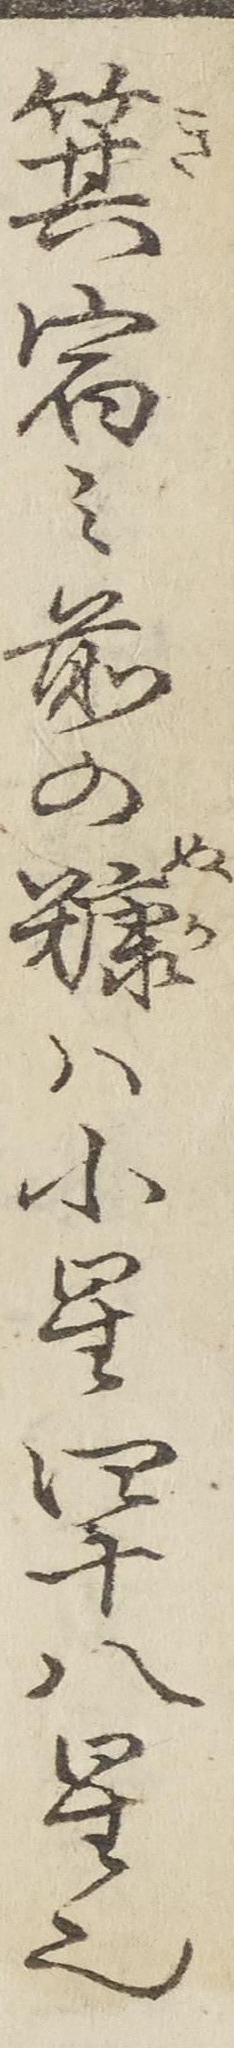箕宿之前の糠は小星四十八星也
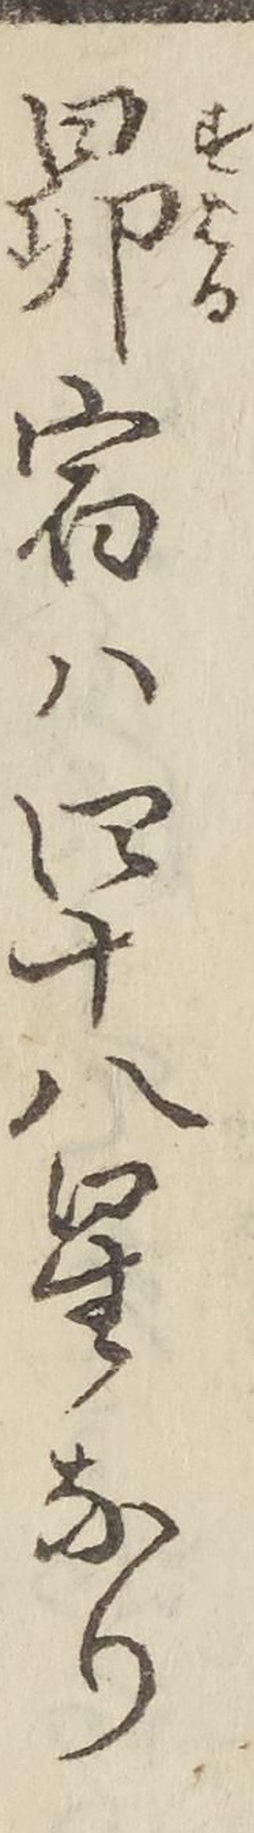昴宿は四十八星なり
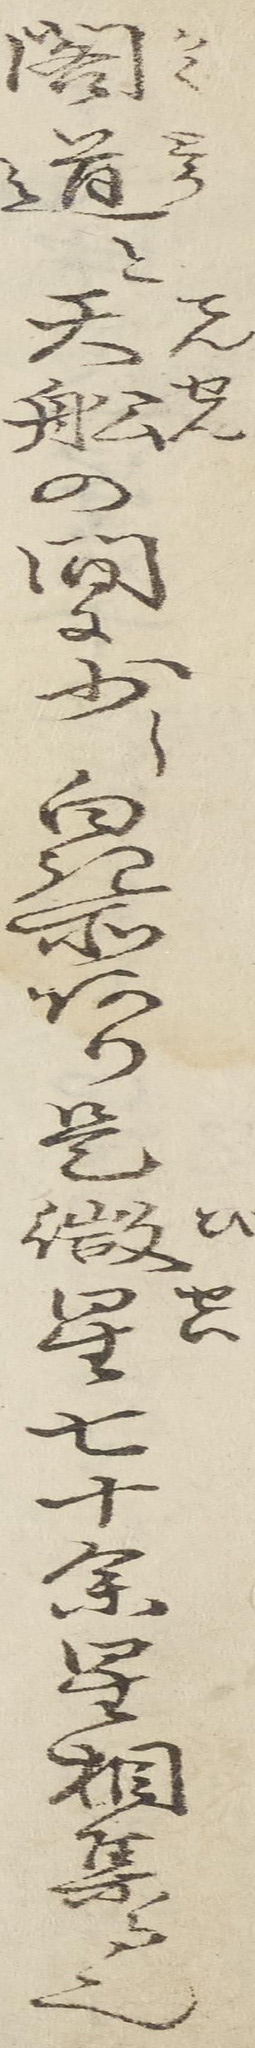閣道と天船の間に少し白き所あり是微星七十余星相集る也
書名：平天儀圖解
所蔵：東京大学地震研究所図書室 Earthquake Research Institute Library, The University of Tokyo, JAPAN
